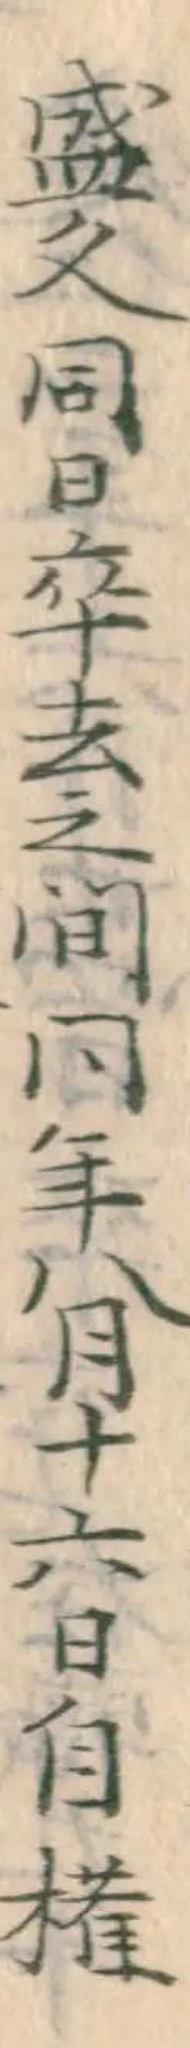盛久同日卒去之間同年八月十六日自権
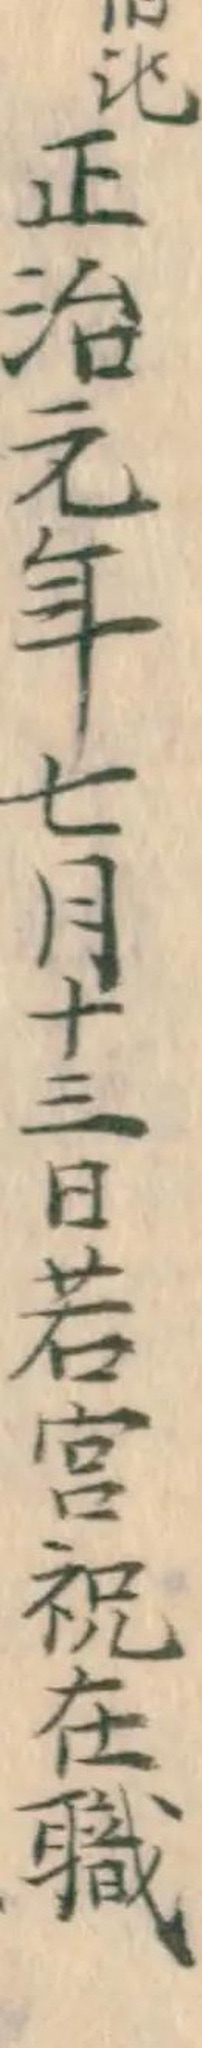正治元年七月十三日若宮祝在職
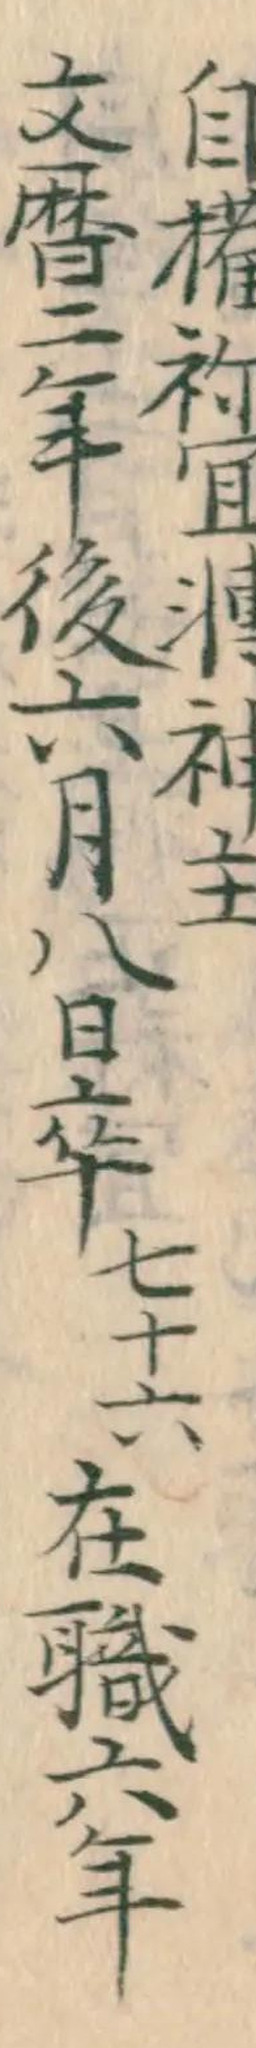文暦二年後六月八日卒七十六在職六年
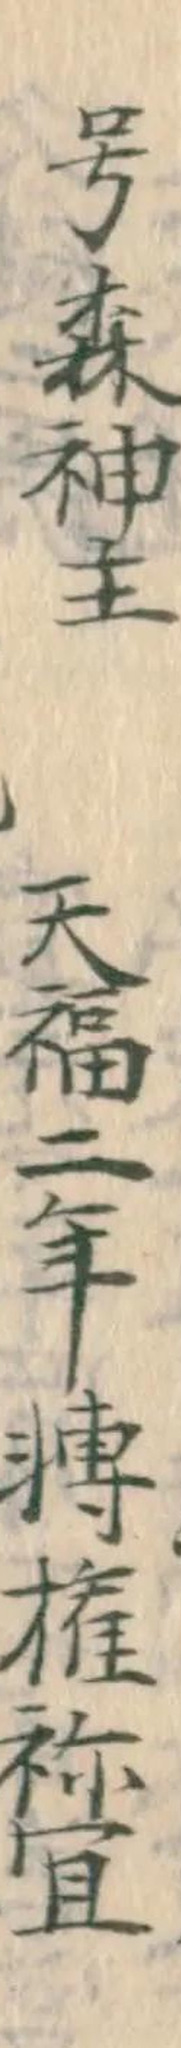号森神主天福二年転権称宜
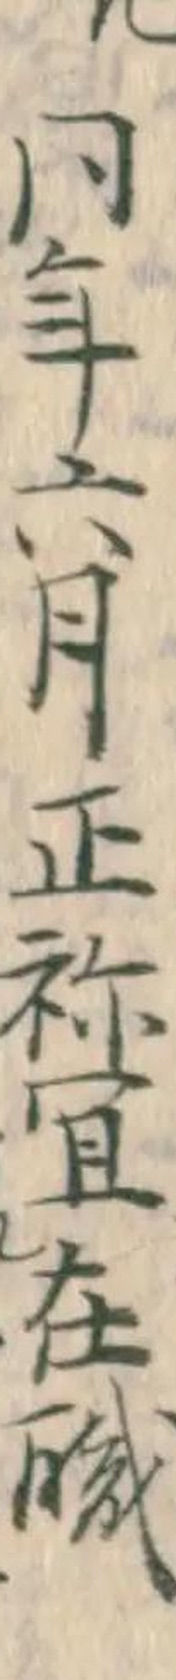同年六月正祢宜在職
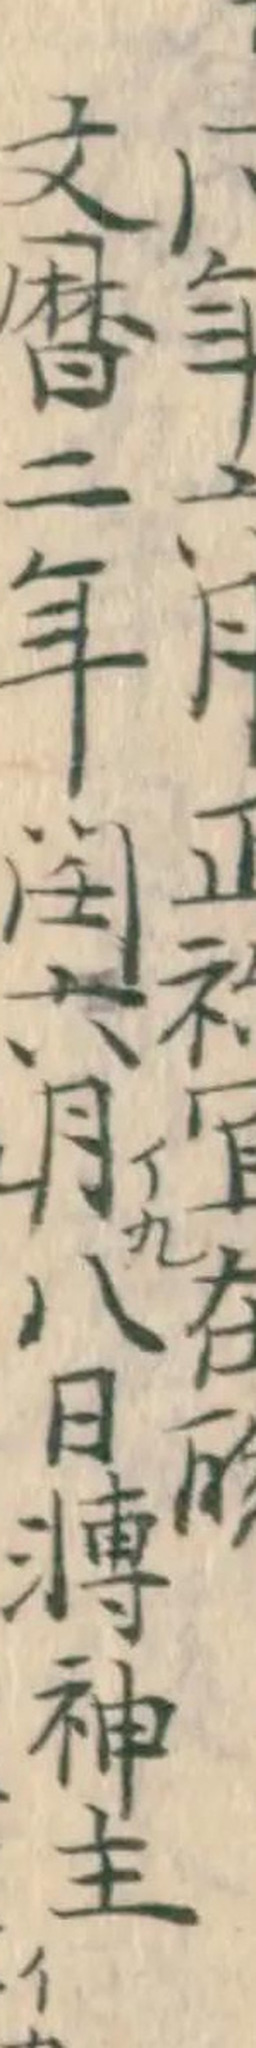文暦二年閏六月八日転神主
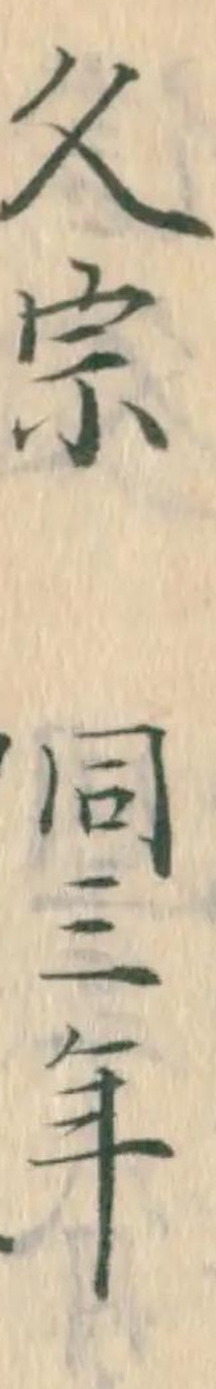久宗同三年
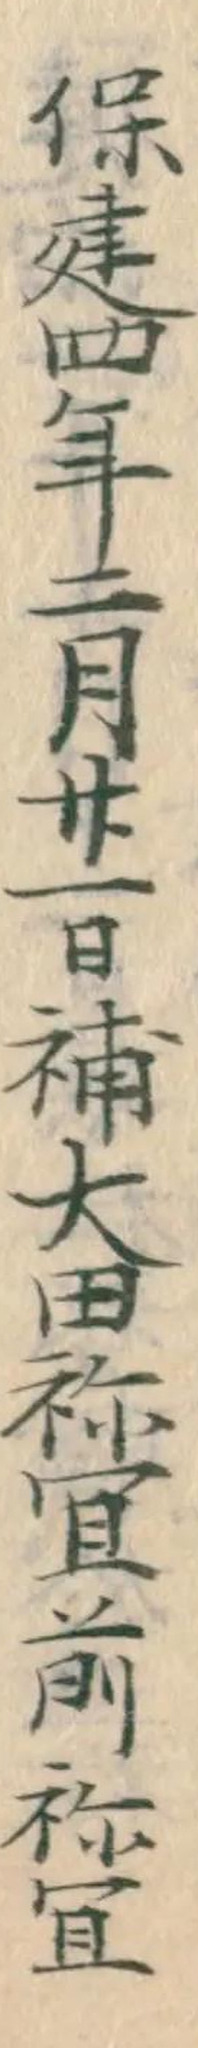能継保建四年二月廿一日補大田祢宜前祢宜
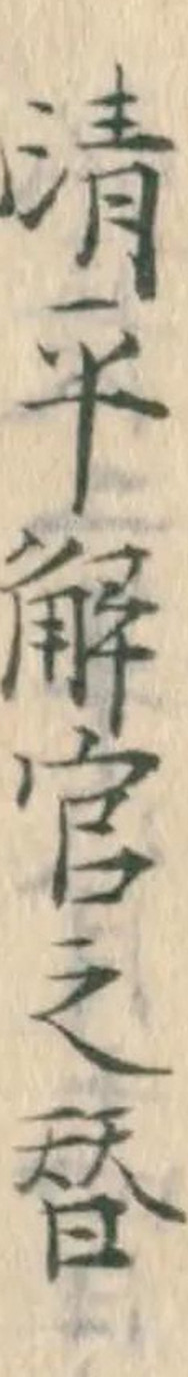清平解官之替
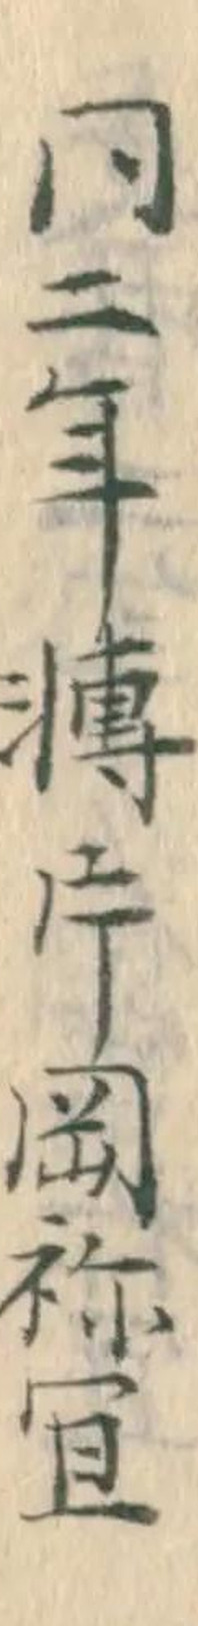同二年転片岡祢宜

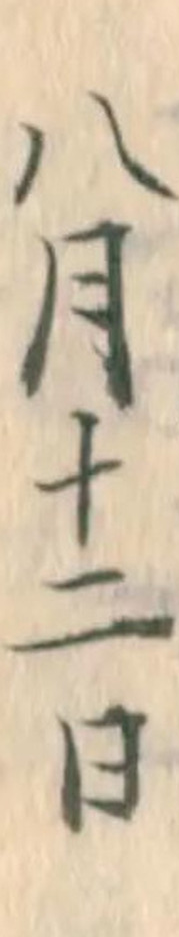五月十一日
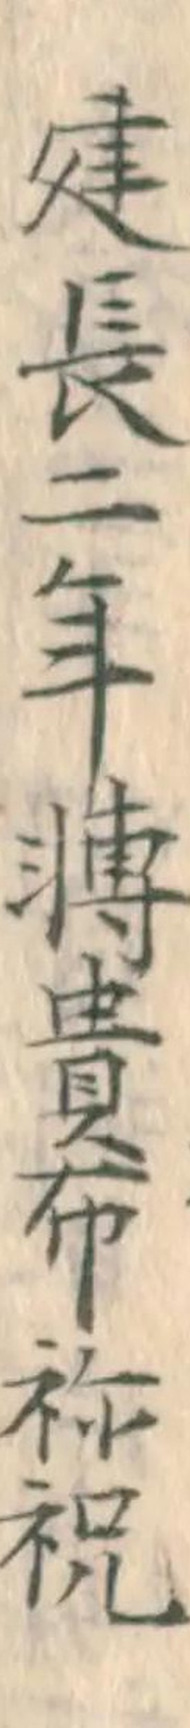建長二年転貴布祢祝
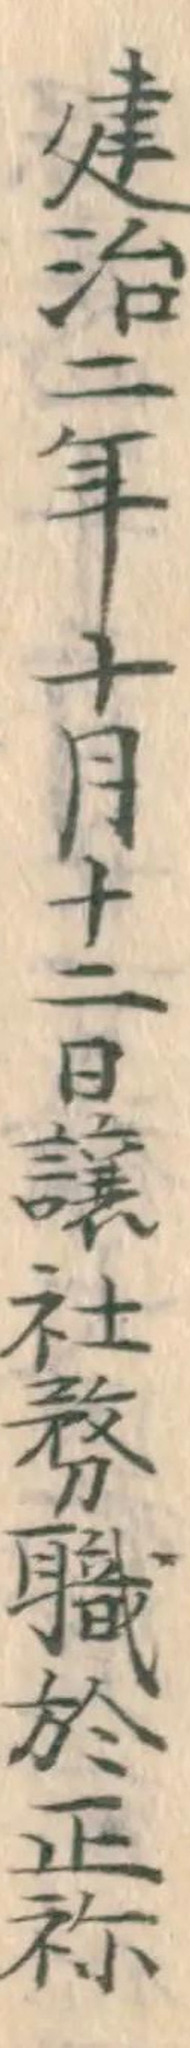建治二年十月十二日譲社務職於正祢
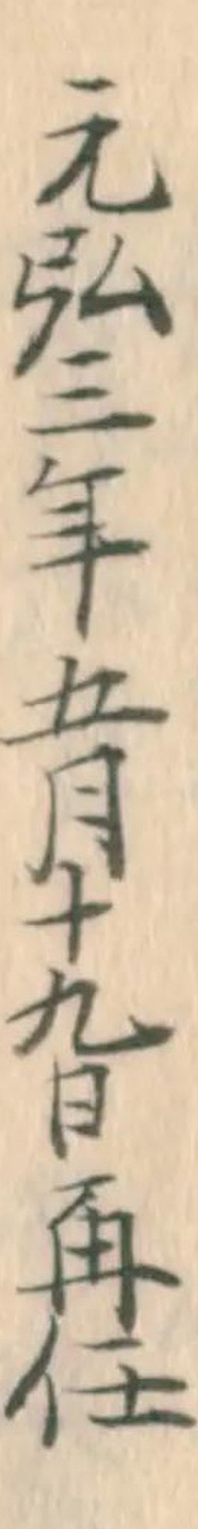元弘三年五月十九日再任
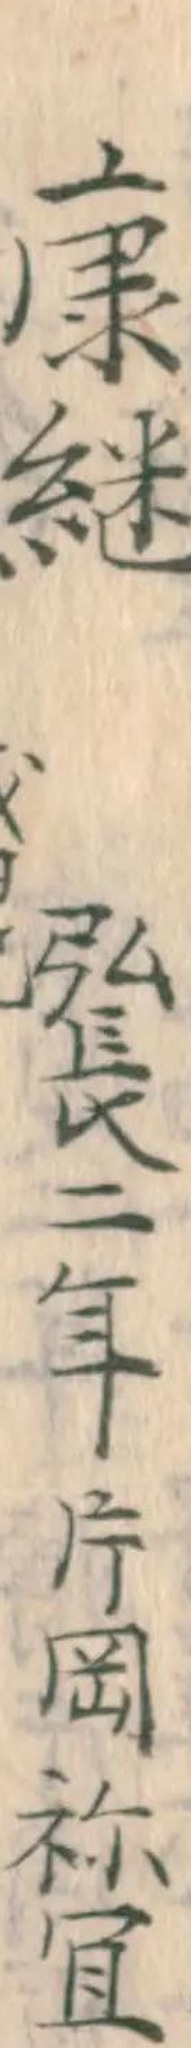康継弘長二年片岡祢宜
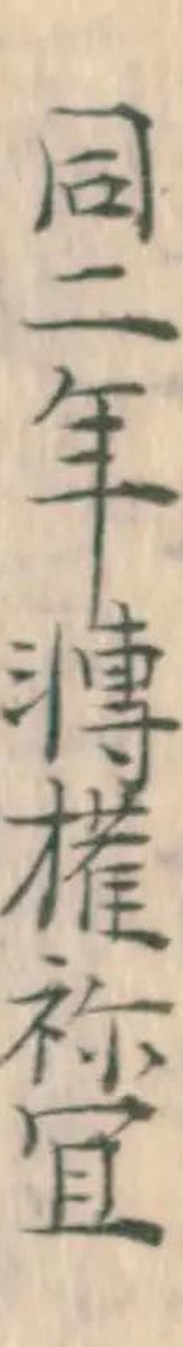建治二年転正祢宜
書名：賀茂社記録. 第23冊
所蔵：国立国会図書館 National Diet Library, JAPAN
